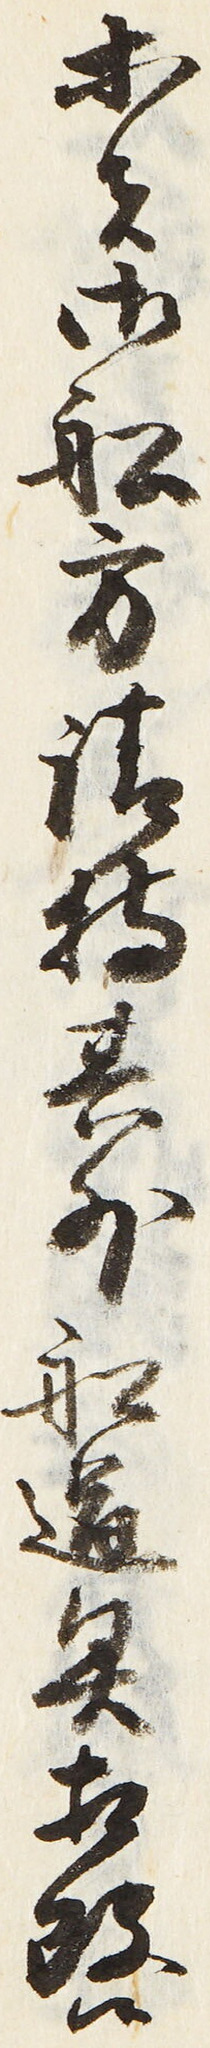等者御船方請持其外船道具相改候
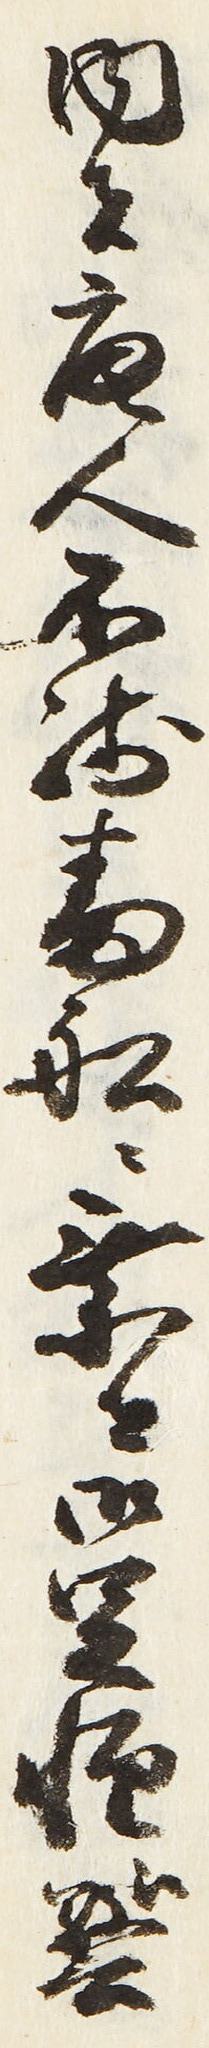内者唐人不残番船ニ乗せ御足軽江警
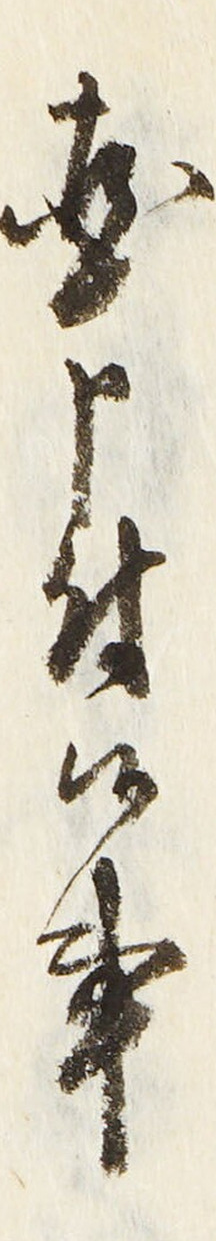固申付候事
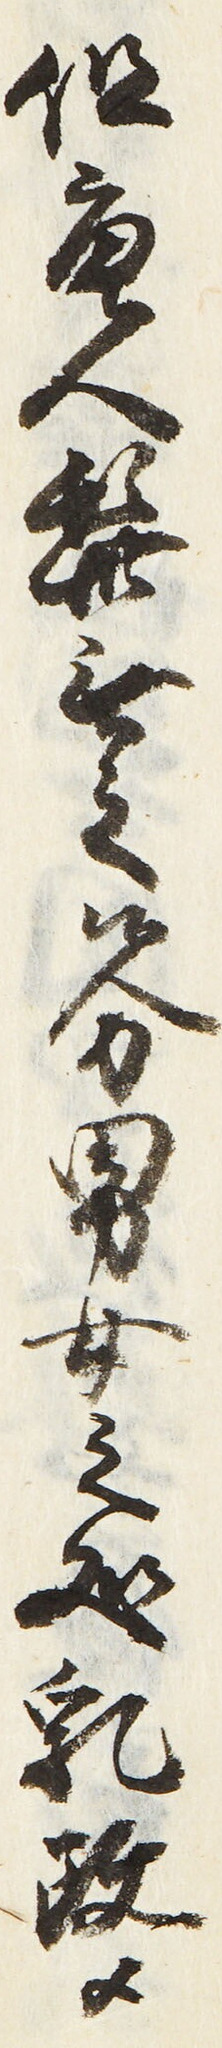但唐人髭無之候分男女之処乳改メ
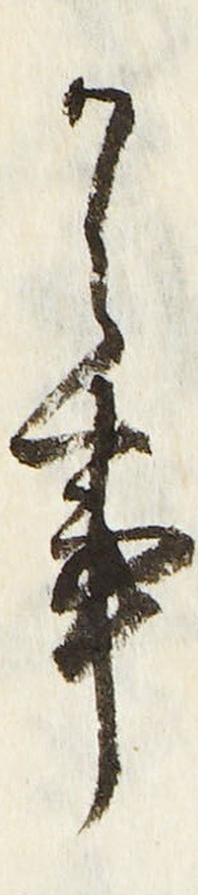候之事
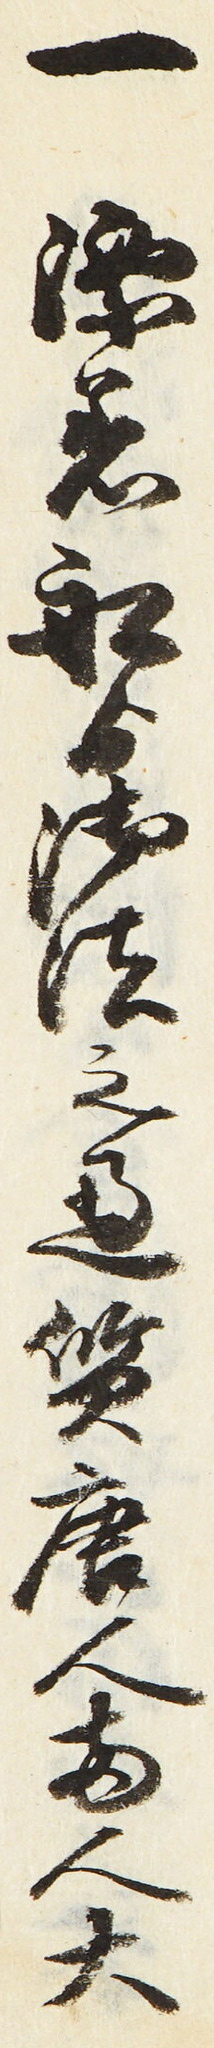一漂着船ゟ御法之通質唐人両人大

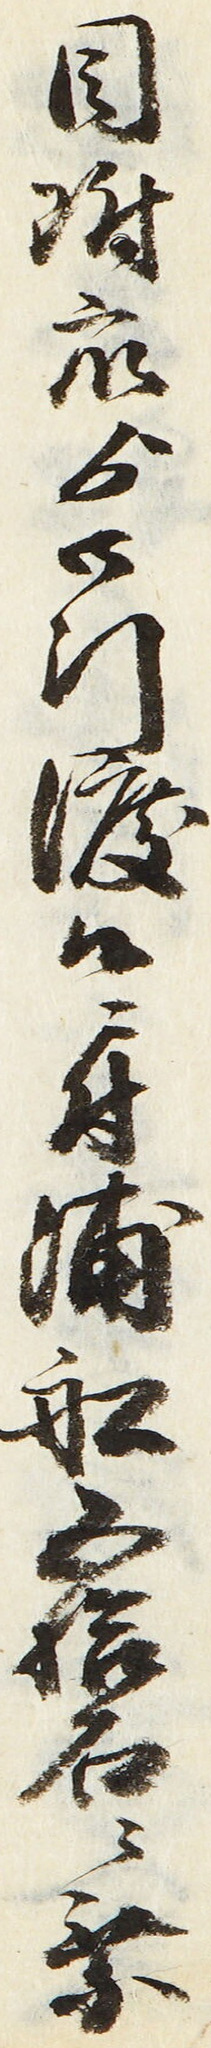目付衆ゟ御引渡候ニ付浦船五拾石ニ乗
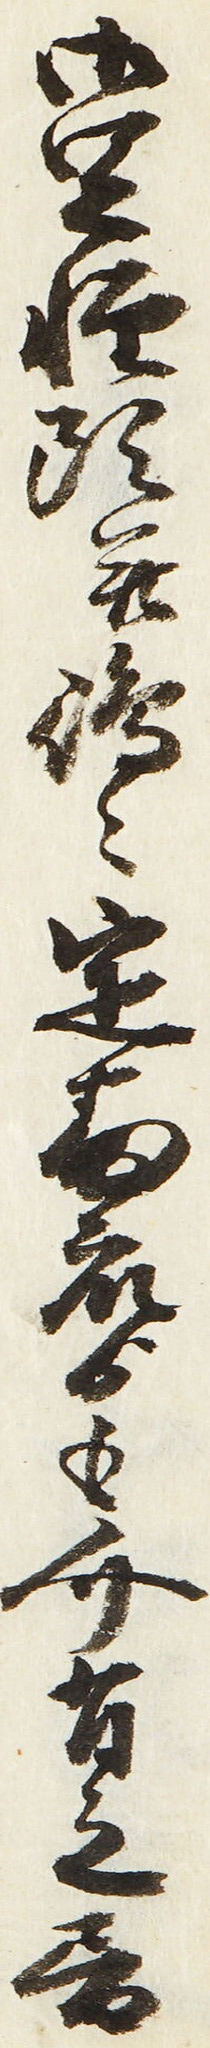御足軽頭并嶋々定番衆ゟも介有之昼
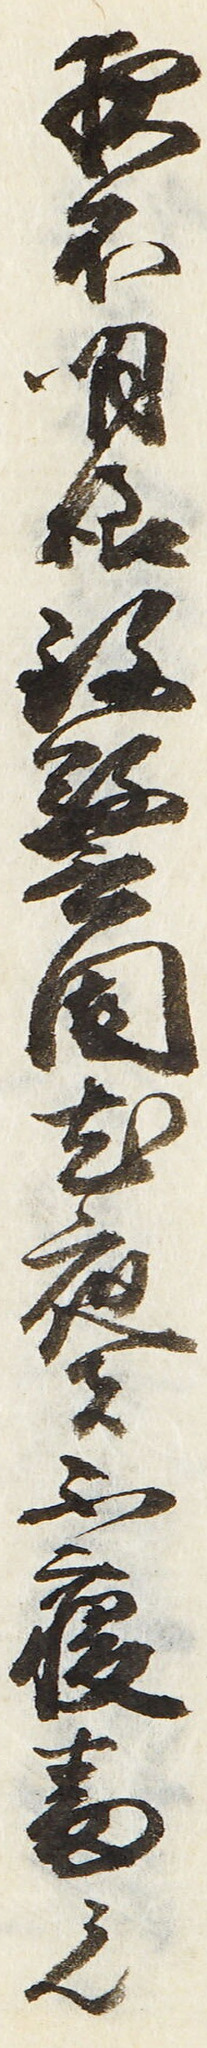夜不明様致警固尤夜者不寝番之
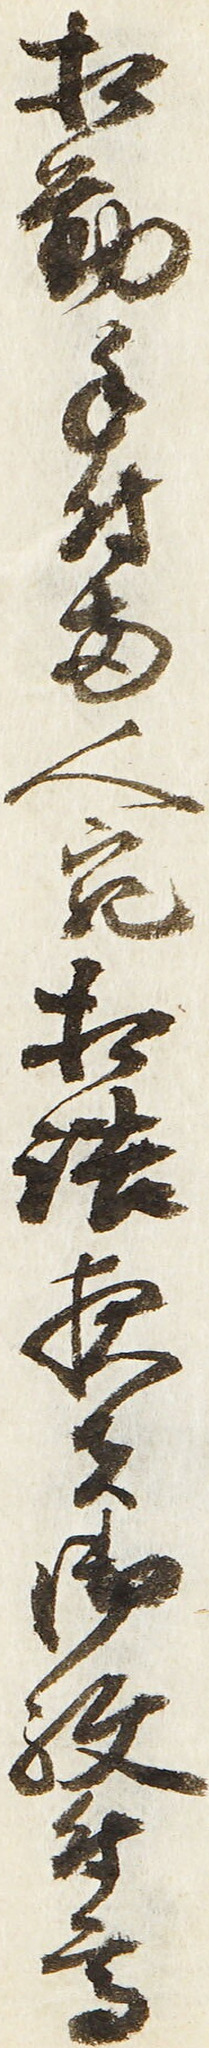相勤手付両人宛相詰夜者御紋付高
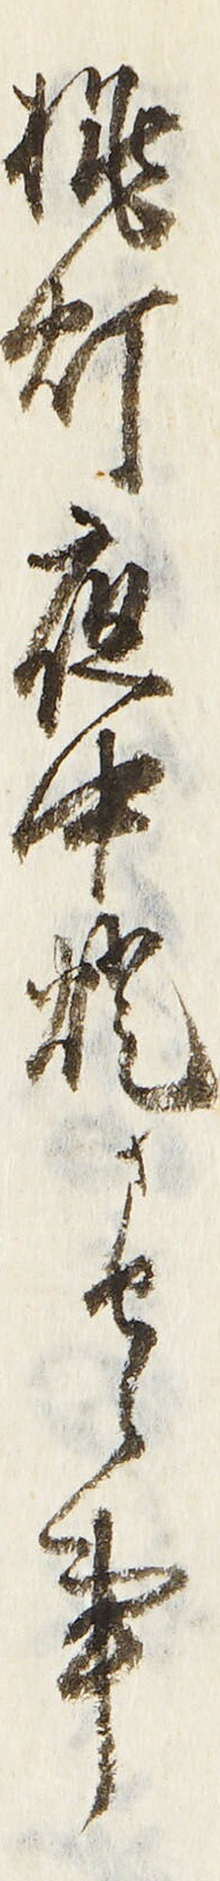挑灯夜中燈さセ候事
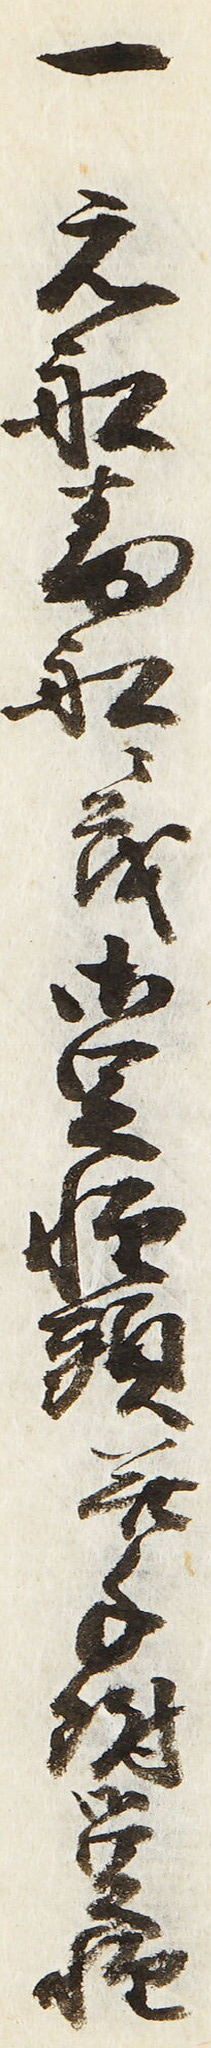一元船番船ニも御足軽頭并手付御足軽
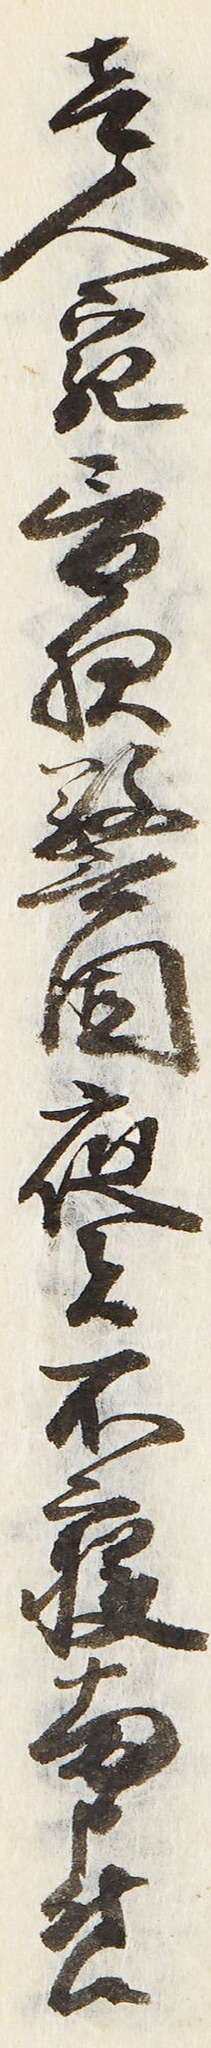壱人宛昼夜警固夜者不寝番申付候
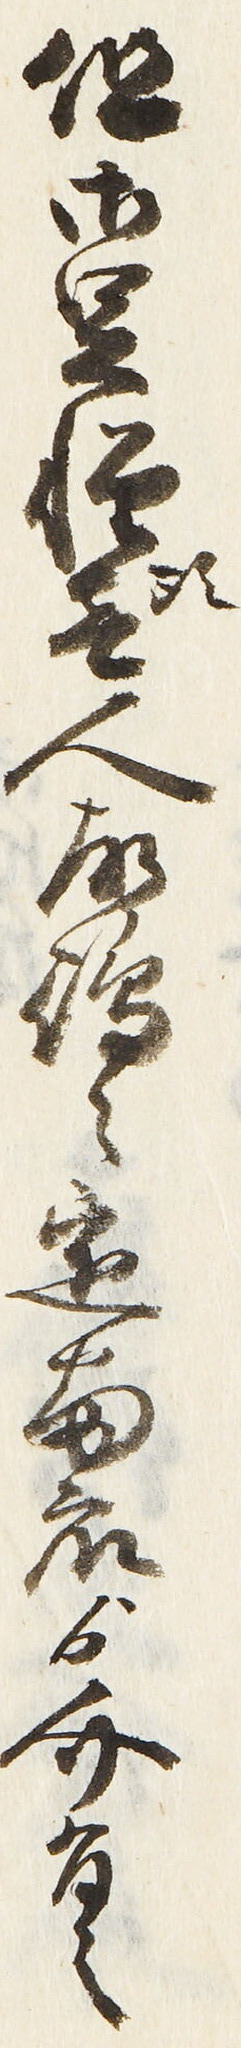但御足軽頭壱人故嶋々定番衆ゟ介有之
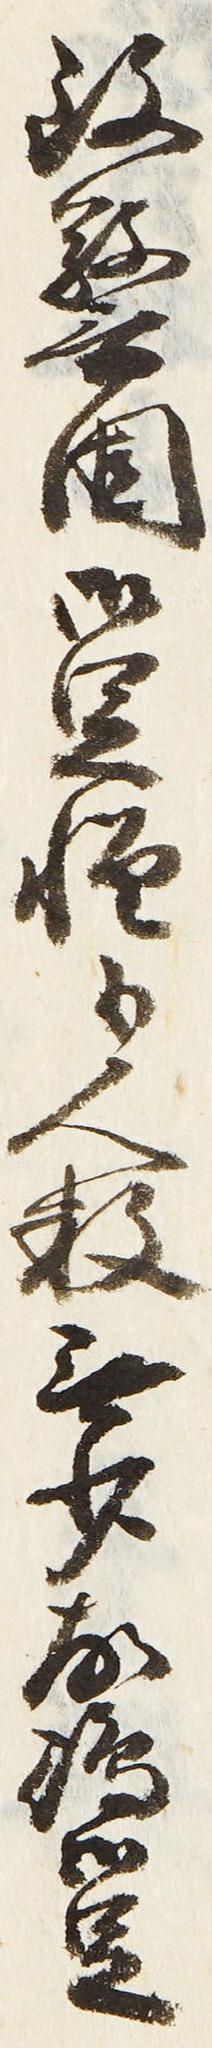致警固御足軽も人数無少故嶋御足
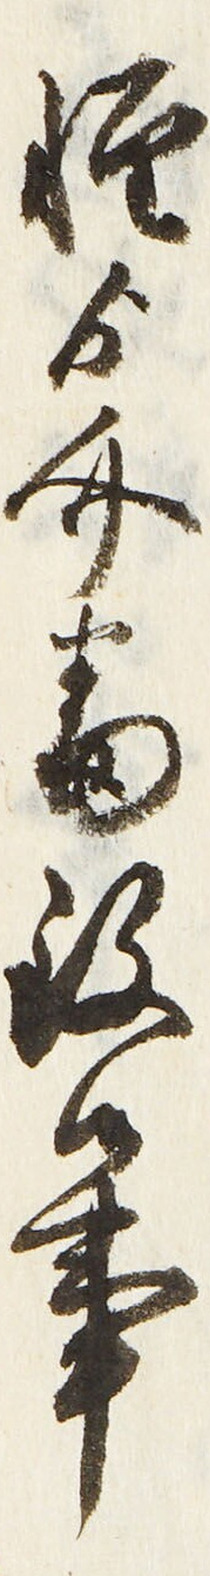軽ゟ介番致候事
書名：玄海嶋江漂着船為警固長崎江被越候覚
